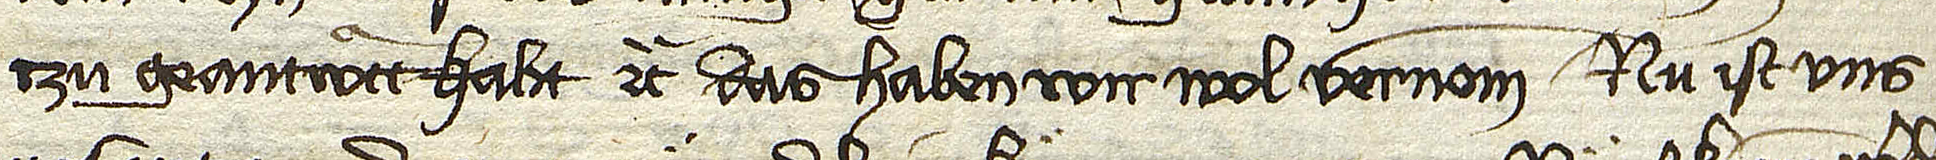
cʒu geantw*tt habt ec* das haben wir wol vernom* / Nu iſt vns
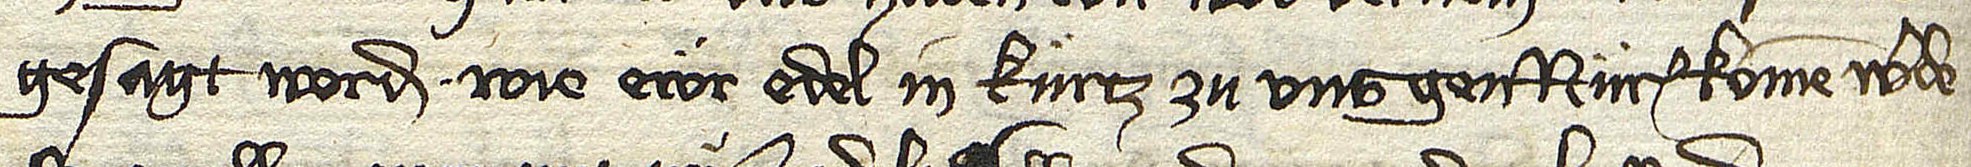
geſagt word* . wie ewr edel in kürcʒ ʒu vns gen Nür* kome* w*de
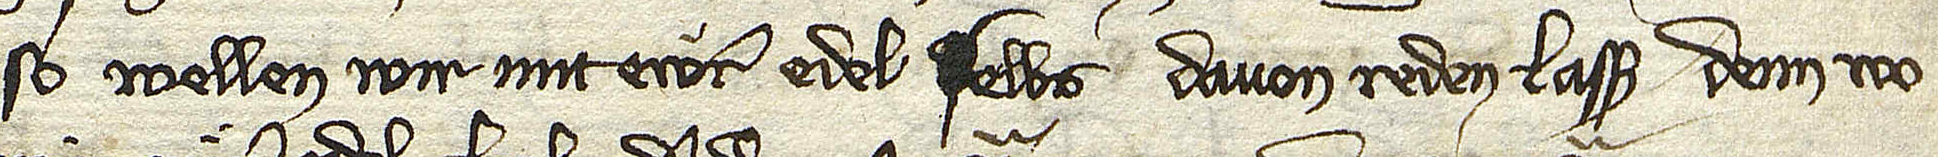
ſo wellen wir mit ew*r edel ſelbs dauon reden laſſ* / denn wo
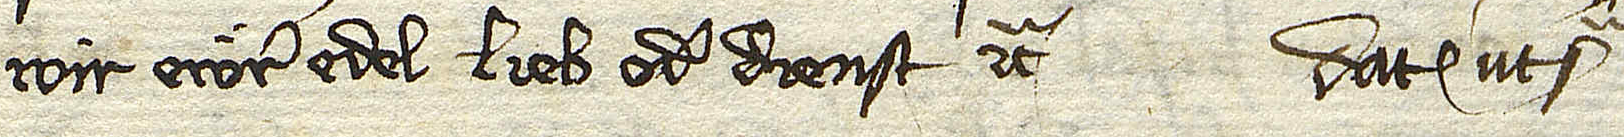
wir ew*r edel lieb od* dienſt ec* Dat ut ſ*
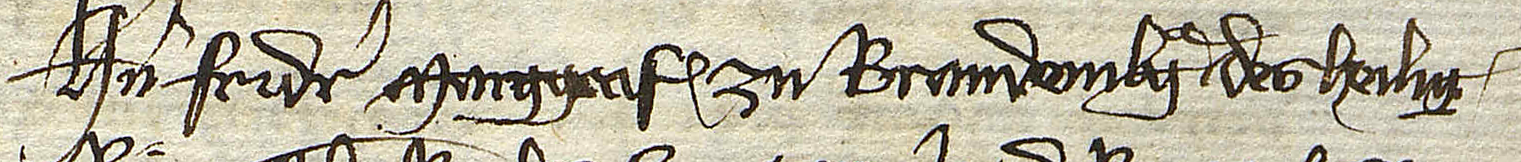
H*n Fridr* Marggraf* ʒu Brandemb*g / des heilig*
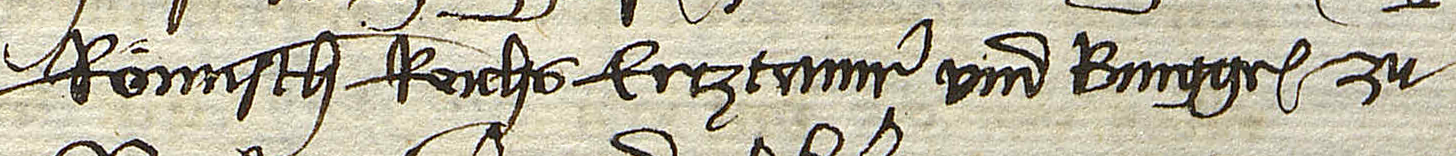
Römiſch* Reichs Ercʒcamr* vnd Burggr* ʒu
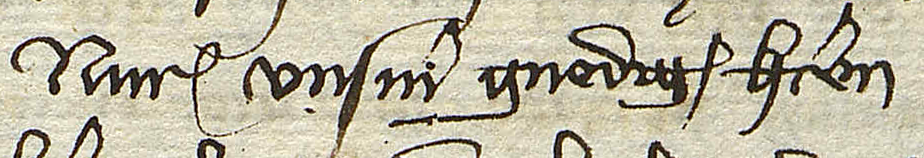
Nur* vnſ*m gnedig* h*ren
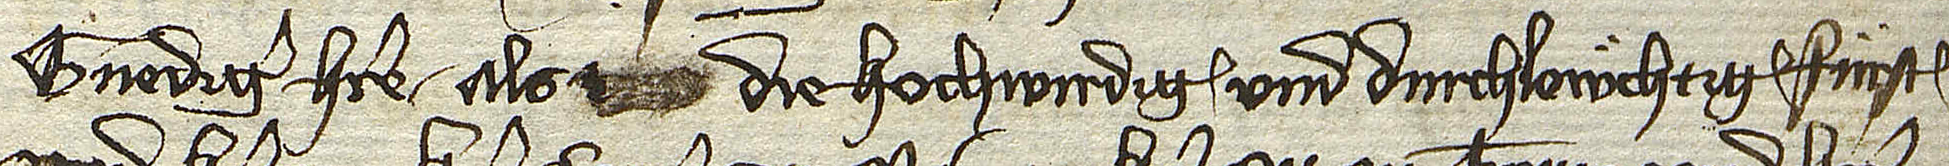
Gnedig* h*re / als vns die hochwirdig* vnd durchlewchtig* fürſt*
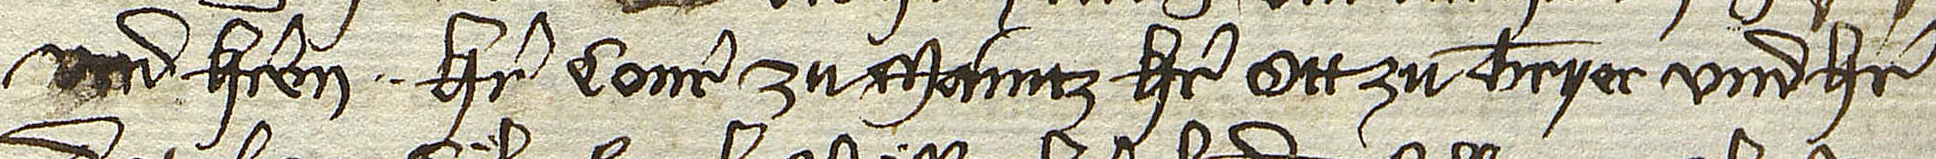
vnd h*ren ~ H*r Conr* ʒu Maincʒ h*r Ott ʒu Tryer vnd h*r
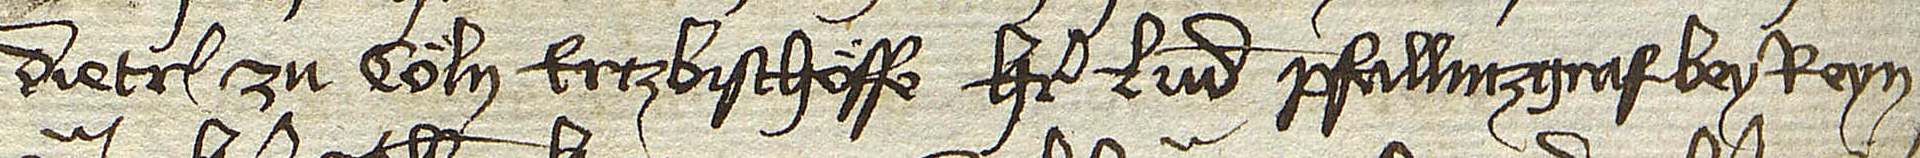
Dietr* ʒu Cöln Ercʒbiſchöffe H*r lud* pfallncʒgraf bey Reyn
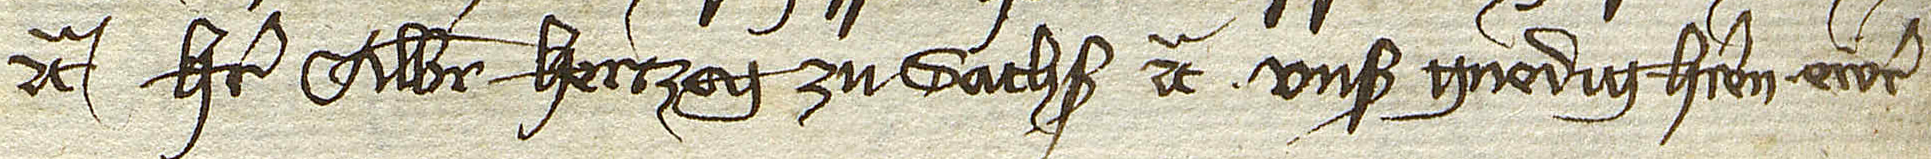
ec* H*r Albr* hercʒog ʒu Sachſ* ec* . vnſ* gnedig h*ren ew*r
